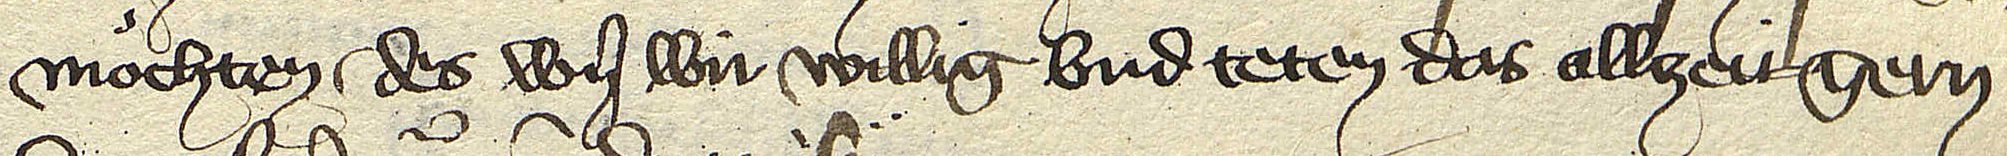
möchten / des wn* wir willig vnd teten das allcʒeit gern
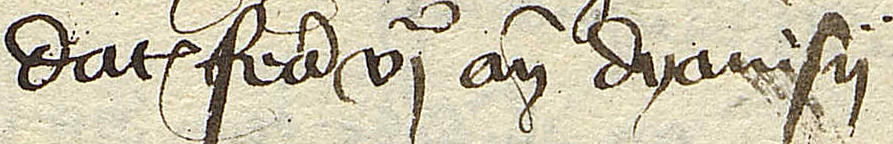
dat* fea* vi* an* dyoniſii
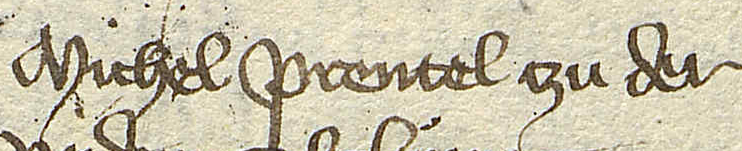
Michel Prentel cʒu der
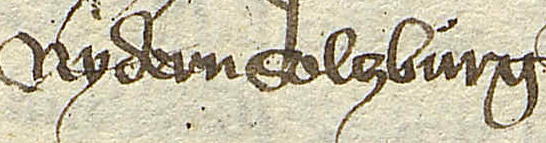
Nydern Solcʒbürg
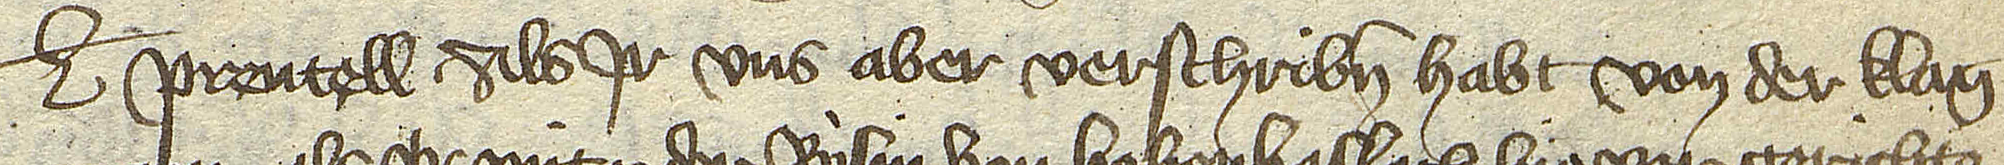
L* prentell / Als Ir vns aber verſchribn* habt von der klag
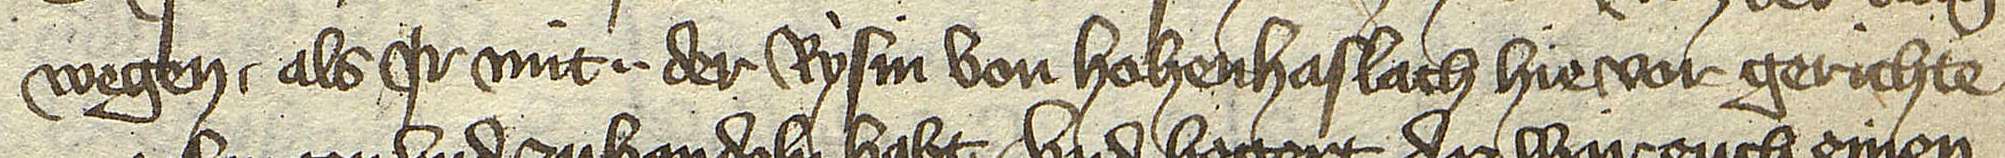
wegen / als Ir mit ~ der Ryſin von hohenhaſlach hie vor gerichte
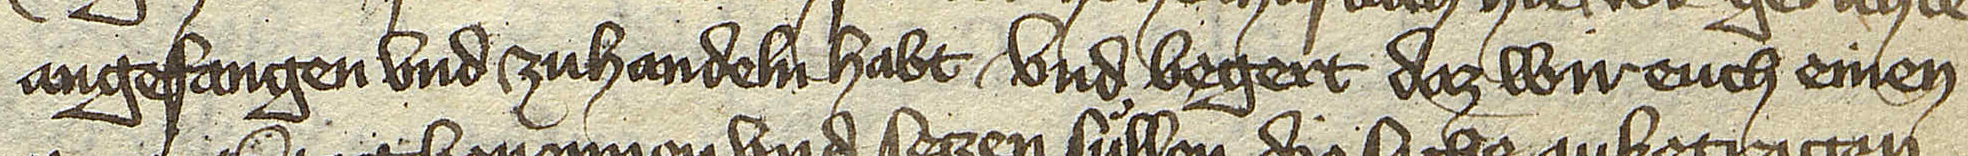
angefangen vnd cʒuhandeln habt / vnd begert daʒ wir euch einen
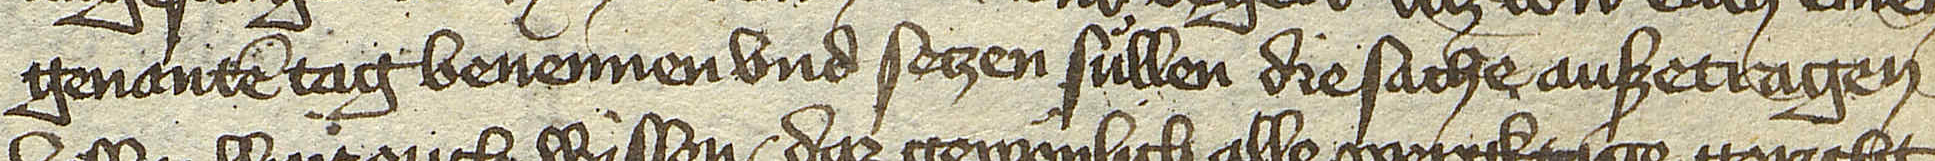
genante* tag benennen vnd ſecʒen ſüllen die ſache auſʒetragen
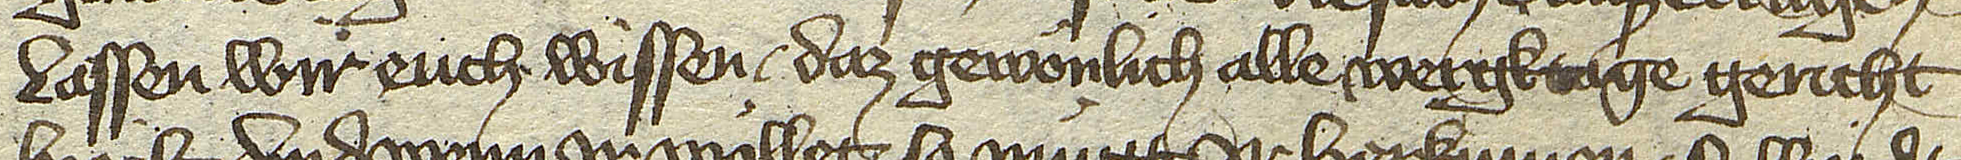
laſſen wir euch wiſſen / daʒ gewönlich alle wergktage gericht
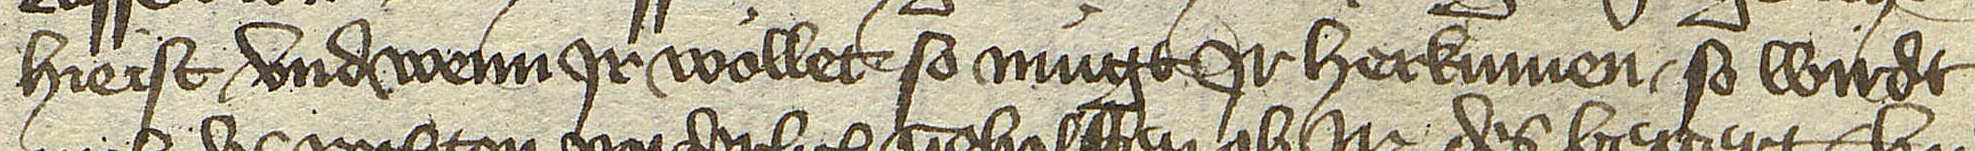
hie iſt / vnd wenn Ir wöllet ſo mügt Ir herkumen / ſo wirdt
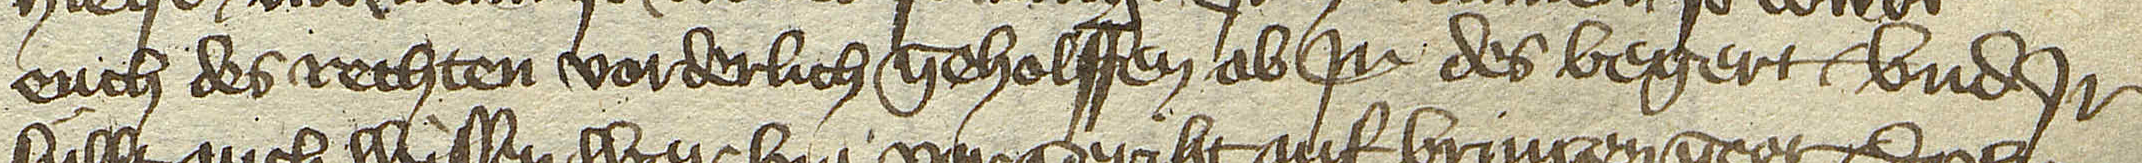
euch des rechten vorderlich geholffen ob Ir des begert / vnd Ir
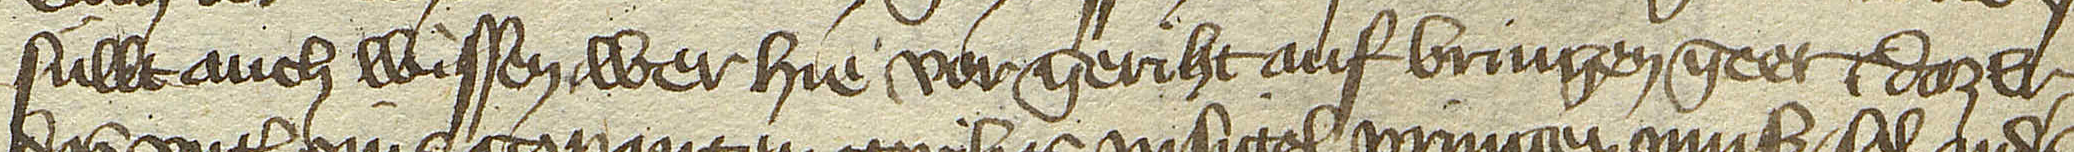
ſüllt auch wiſſen / wer hie vor geriht auf bringen geet / daʒ Er
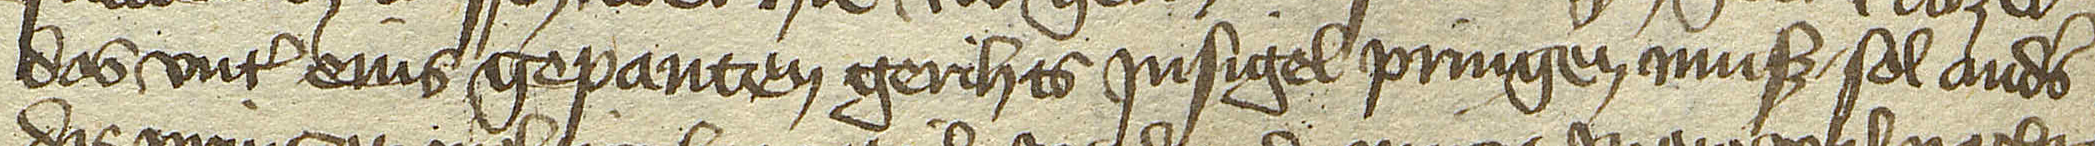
das vnt* eins gepanten gerihts Inſigel pringen muſʒ / ſol ands*
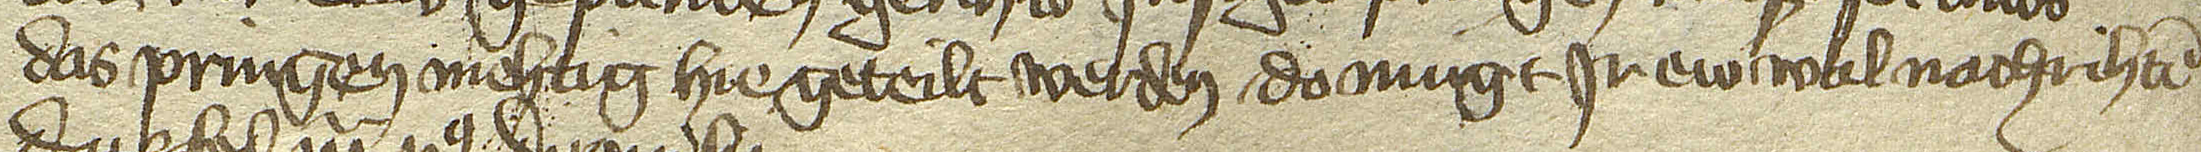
das pringen mehtig hie geteilt werden / do mügt Ir ew wol nachrihte*
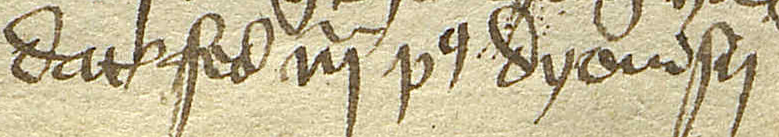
dat* fea* iii* p* dyoniſii
